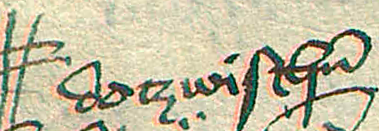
docʒwiſchn*
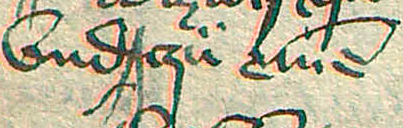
vnd cʒü eine*
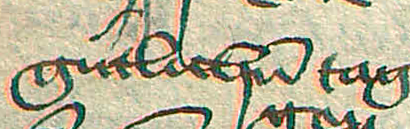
gütlichn* tag
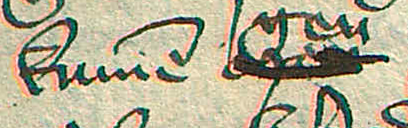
kume Milt
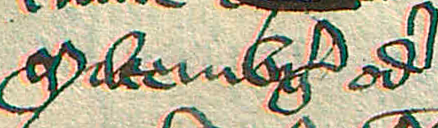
Miltemb*g od*
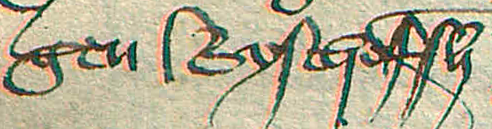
gen Byſchofſh*
